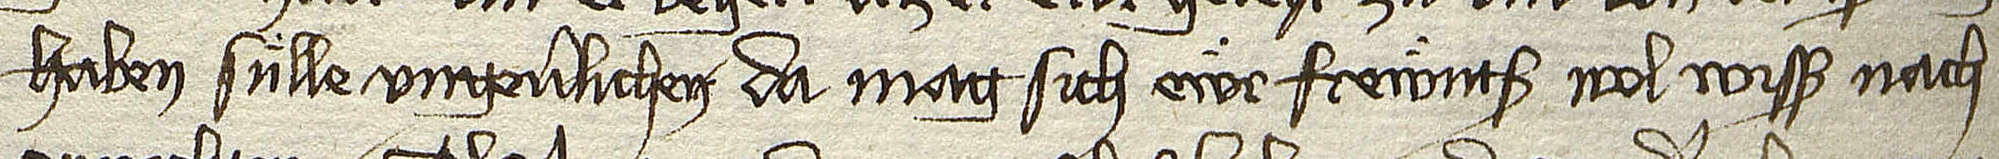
haben ſülle vngeu*lichen da mag ſich eẅr freẅntſ* wol wiſſ* nach
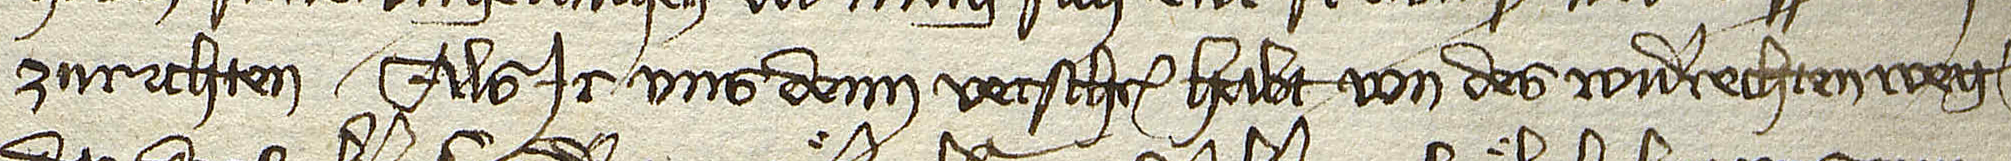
ʒurichten / Als Ir vns denn verſchr* habt von des wid*rechten weg*
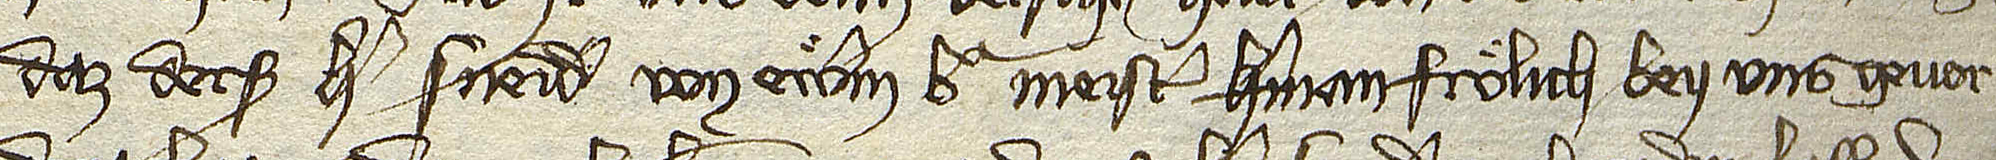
daʒ derſ* h* ſneid* von eẅ*m b* meiſt h*man frölich bey vns geuor =
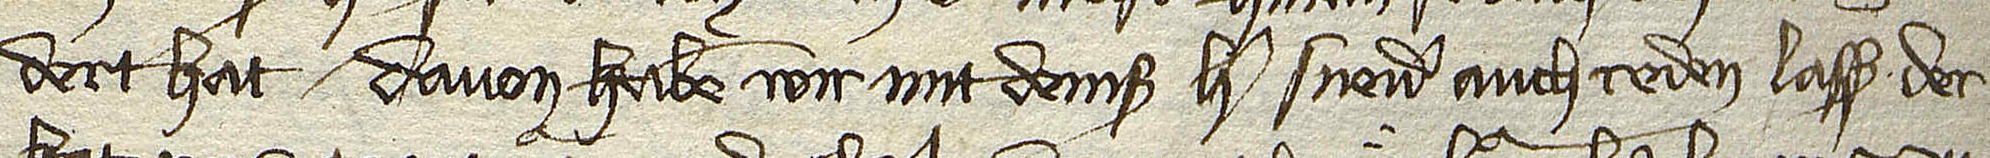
dert hat / Davon habe* wir mit demſ* h* ſneid* auch reden laſſ* . der
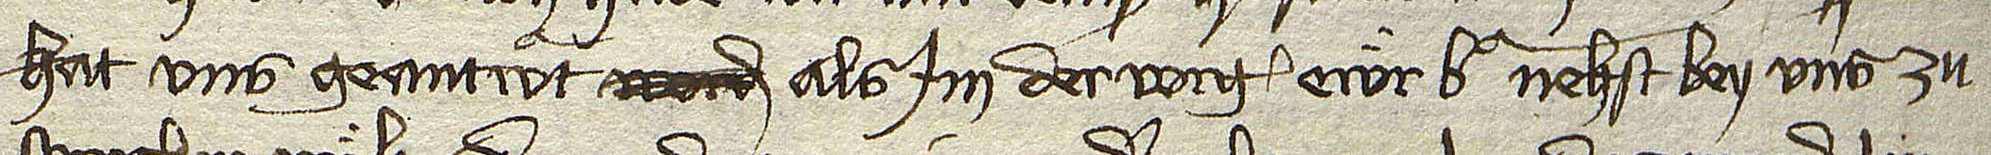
hat vns geantw*t word* als Im der vorg* eẅr b* nehſt bey vns ʒu
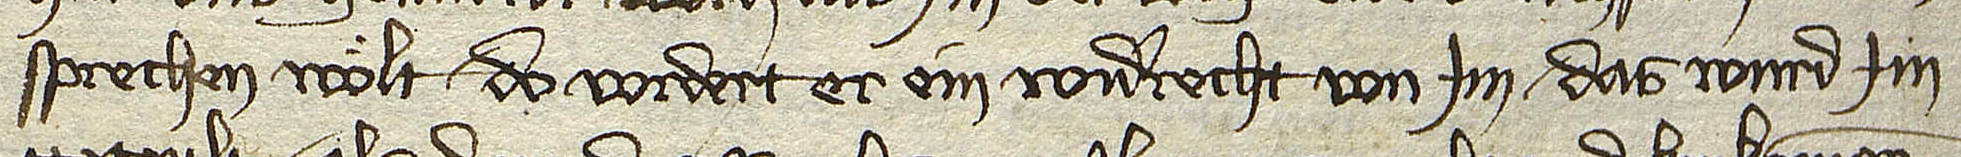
ſprechen wölt / Do vordert er ein wid*recht von Im / Das wurd Im
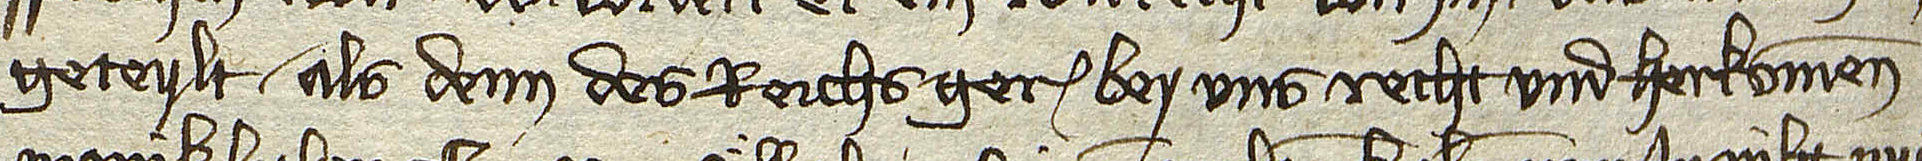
geteylt / als denn des Reichs ger* bey vns recht vnd herk*omen
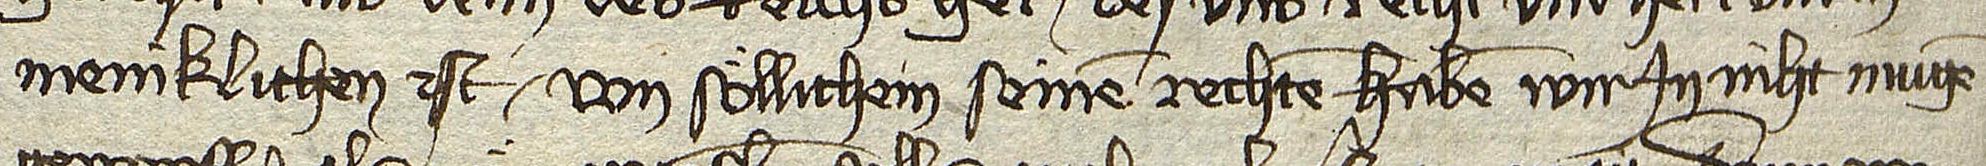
meniklichen iſt / von ſöllichem ſeine* rechte* habe* wir In niht muge*
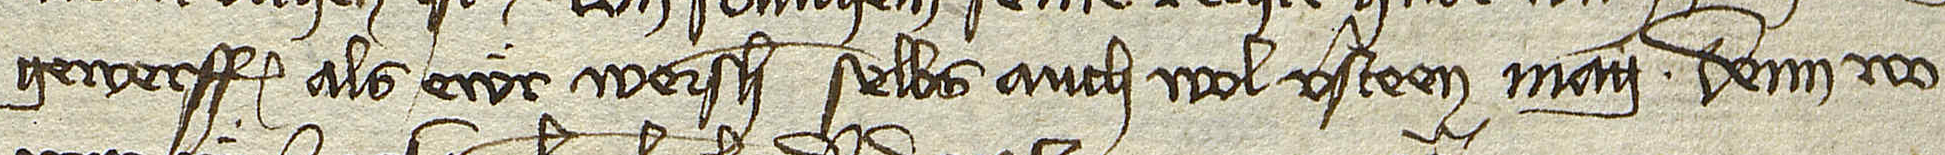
gewerff* als eẅr weiſh* ſelbs auch wol v*ſteen mag* . Denn wo
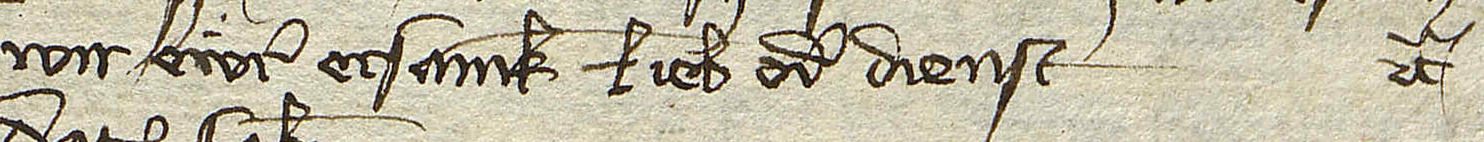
wir eẅr* erſamk* lieb od* dienſt ec*
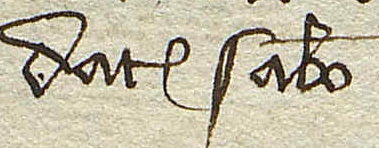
Dat* ſabo*
